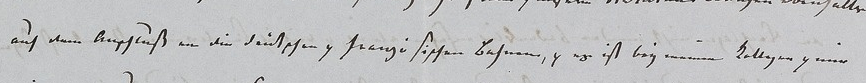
auf dem Anschluß an die deutschen & französischen Bahnen, & es ist bey meinen Kollegen & mir
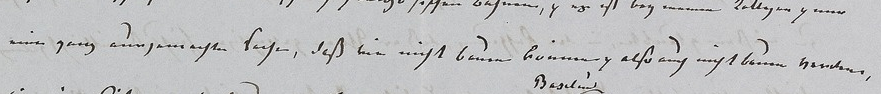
eine ganz ausgemachte Sache, daß wir nicht bauen können & also auch nicht bauen werden,
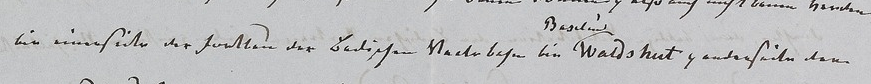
bis einerseits der Fortbau der Badischen Staatsbahn bis Basel undWaldshut & anderseits der
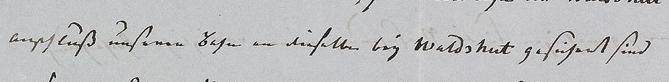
Anschluß unserer Bahn an dieselbe bey Waldshut gesichert sind.
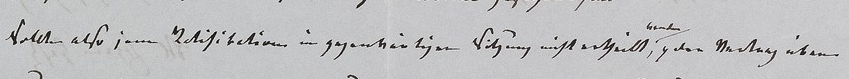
Sollte also jene Ratifikation in gegenwärtiger Sitzung nicht ertheilt werden, & der Vertrag über
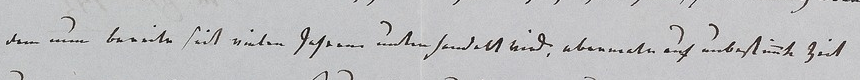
den nun bereits seit vielen Jahren unterhandelt wird, abermals auf unbestimmte Zeit
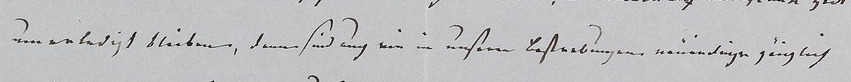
unerledigt bleiben, dann sind auch wir in unseren Bestrebungen neuerdings gänzlich
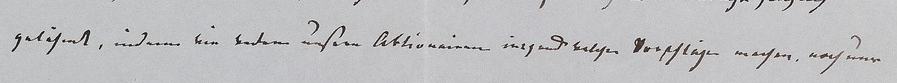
gelähmt, indem wir weder unsern Aktionairen irrgend welche Vorschläge machen, noch uns
